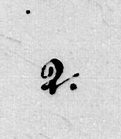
2.
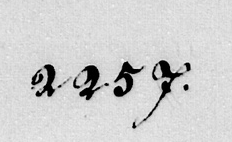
2257.
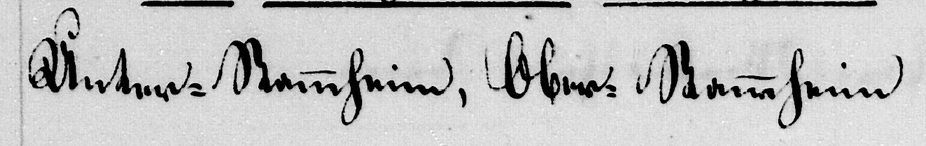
Unter-Stammheim, Ober-Stammheim
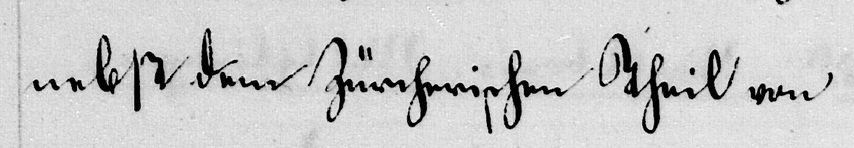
nebst dem Zürcherischen Theil von
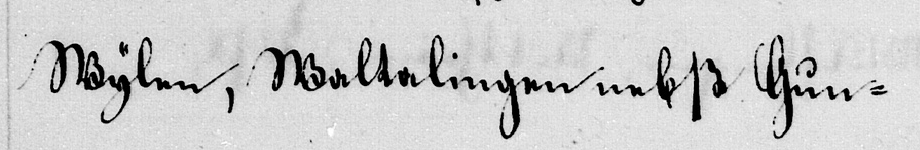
Wylen, Waltalingen nebst Gun¬
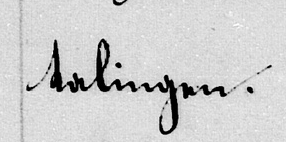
talingen.
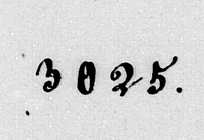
3025.
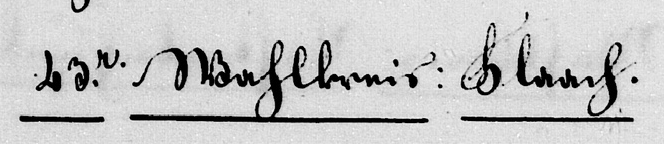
43.r. Wahlkreis: Flaach.
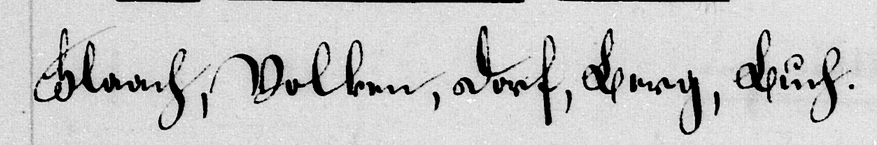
Flaach, Volken, Dorf, Berg, Buch.
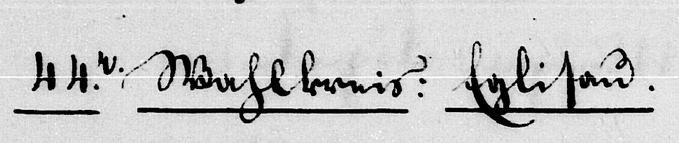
44.r. Wahlkreis: Eglisau.
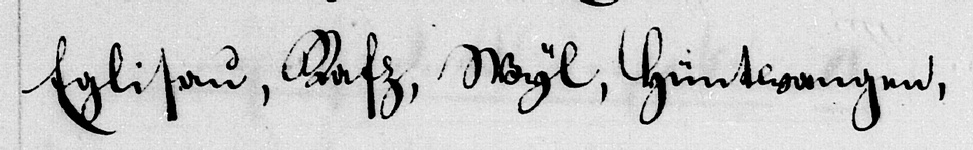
Eglisau, Rafz, Wyl, Hüntwangen,
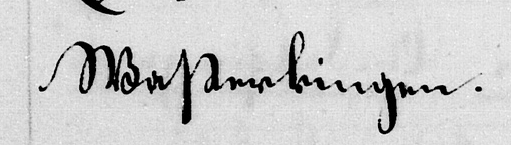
Wasterkingen.
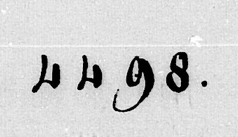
4498.
